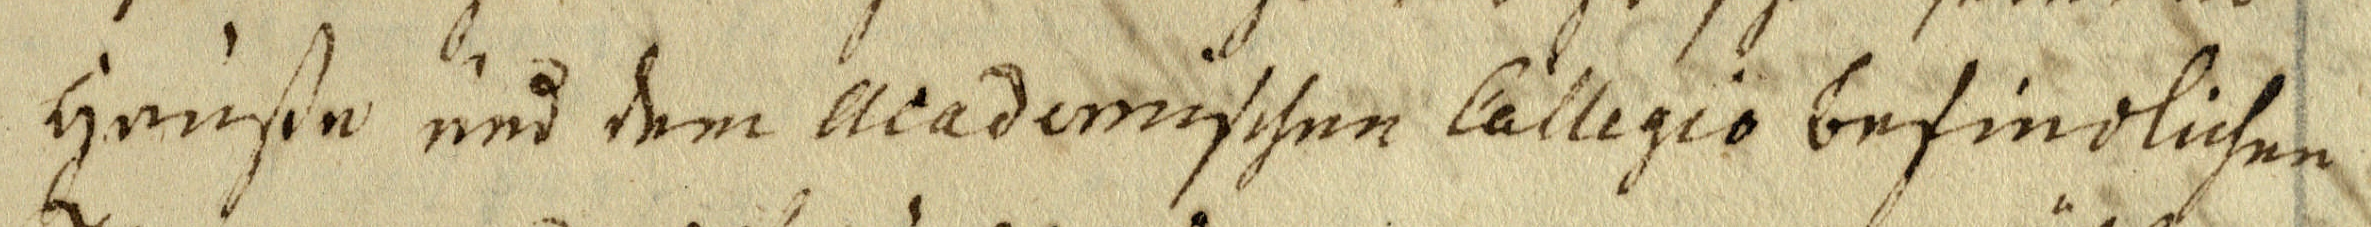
Hauße und dem Academischen Collegio befindlichen
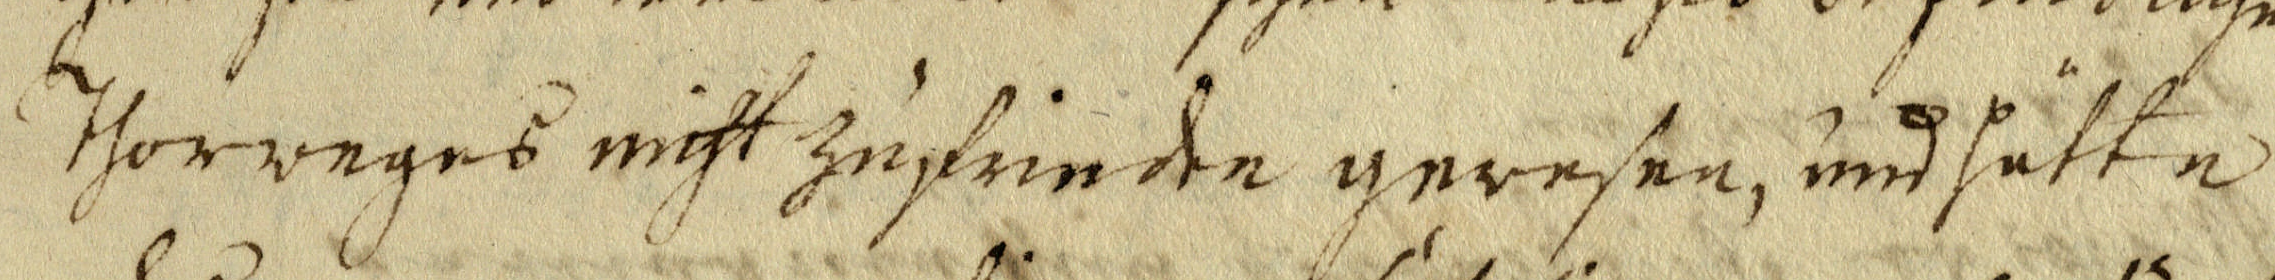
Thorweges nicht zufrieden gewesen, und hätte
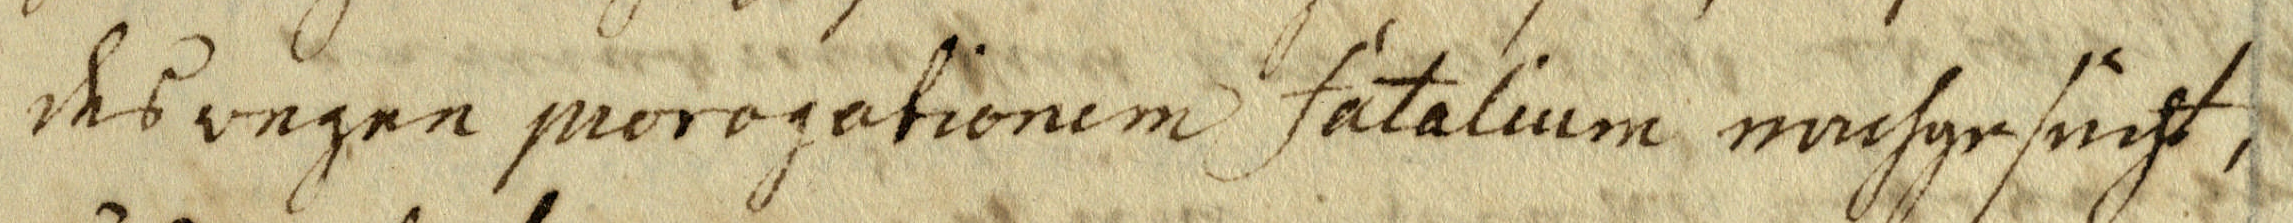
deswegen prorogationem fatalium nachgesucht,
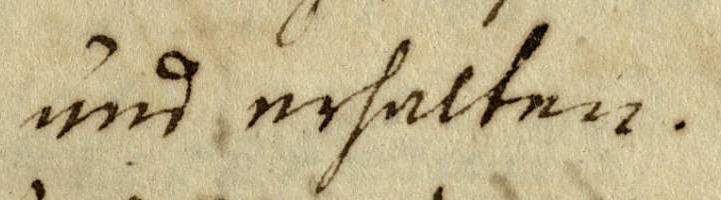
und erhalten.
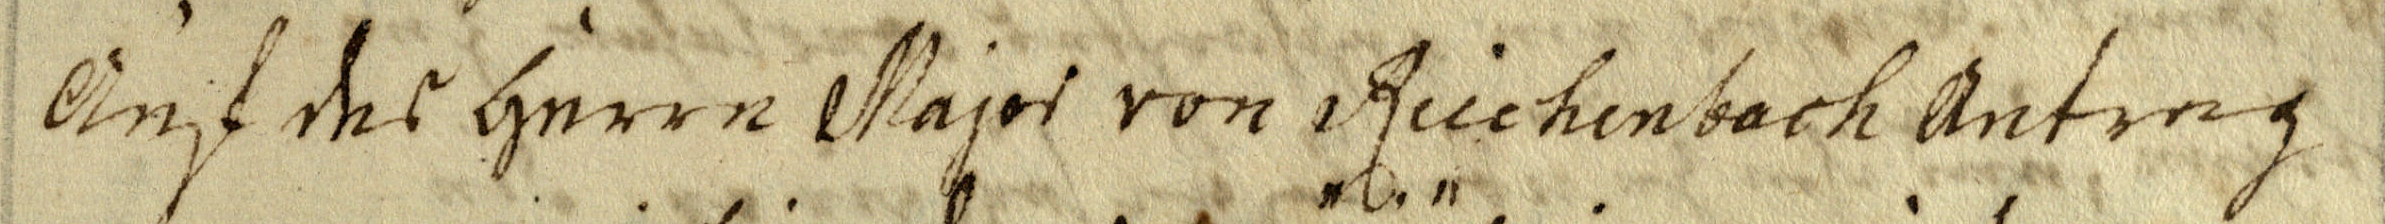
2, Auf des Herrn Major von Reichenbach Antrag
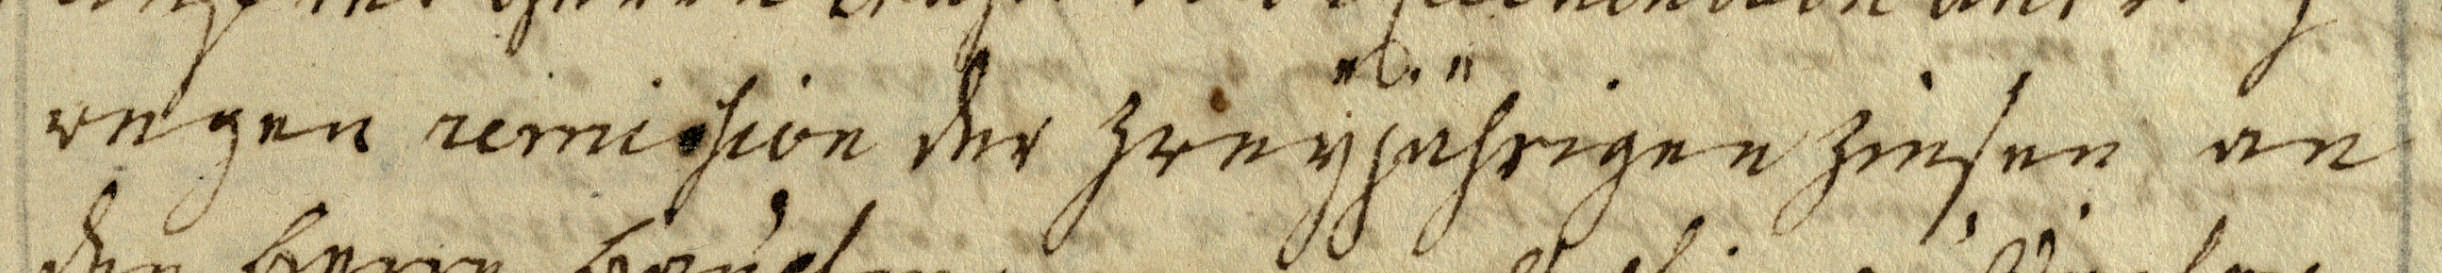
wegen remission der zweÿjährigen Zinsen an
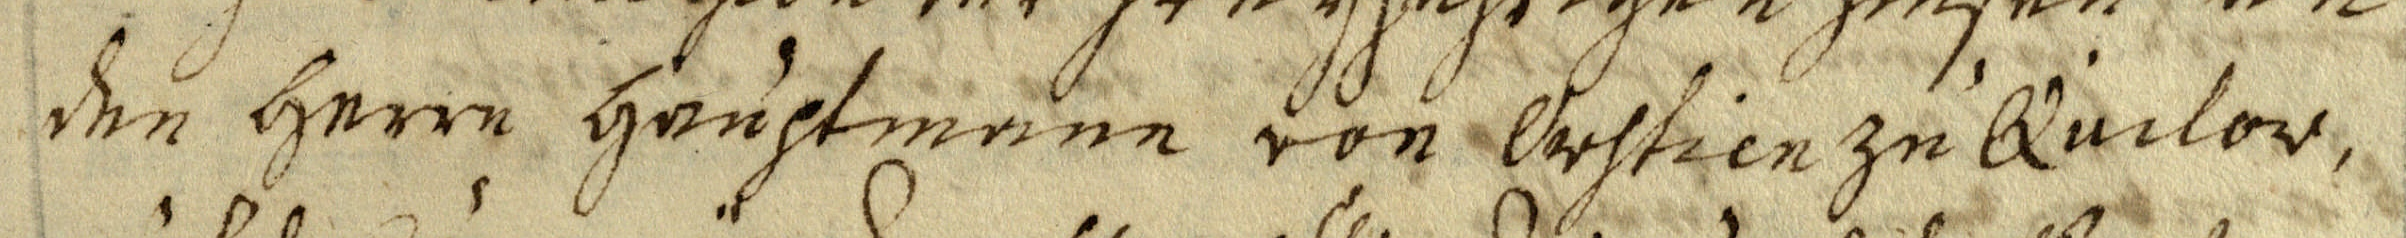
den Herrn Hauptmann von Owstien zu Quilow,
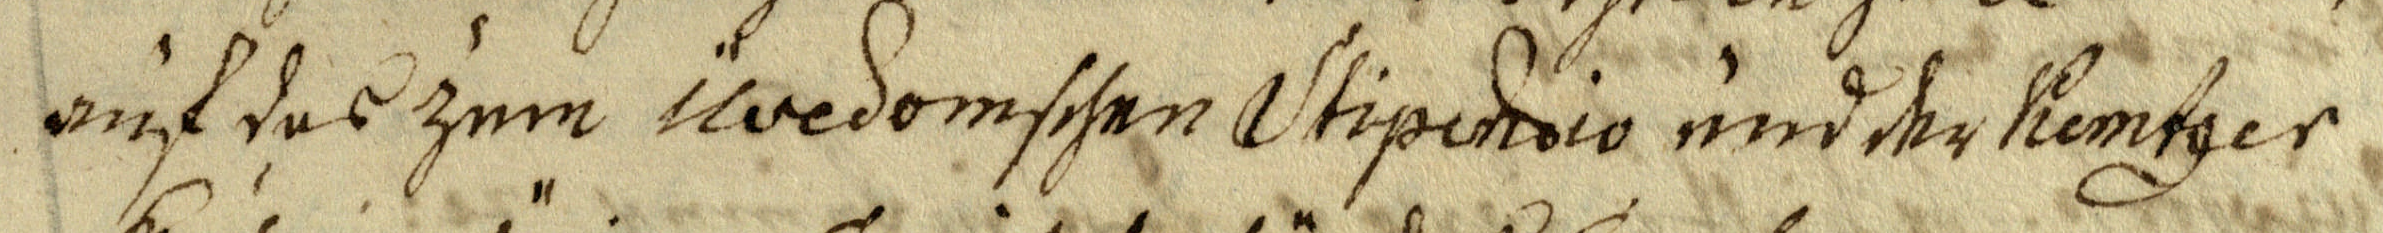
auf das zum Usedomschen Stipendio und der Kemtzer
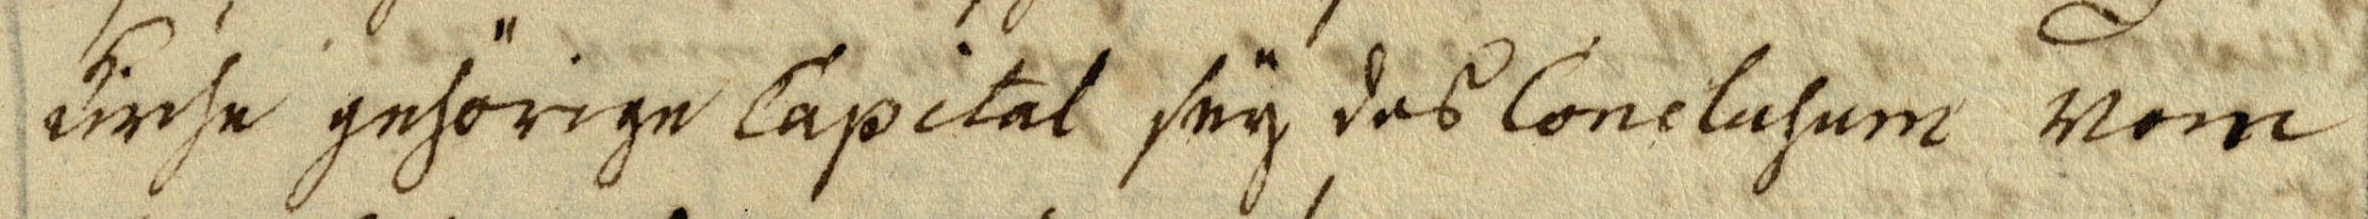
Kirche gehörige Capital seÿ das Conclusum vom
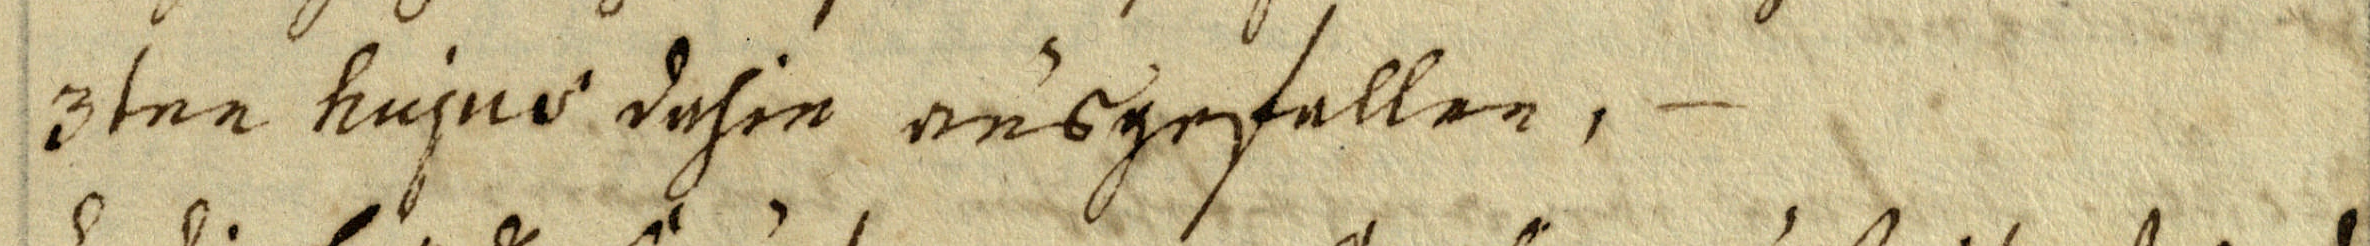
3ten hujus dahin ausgefallen.
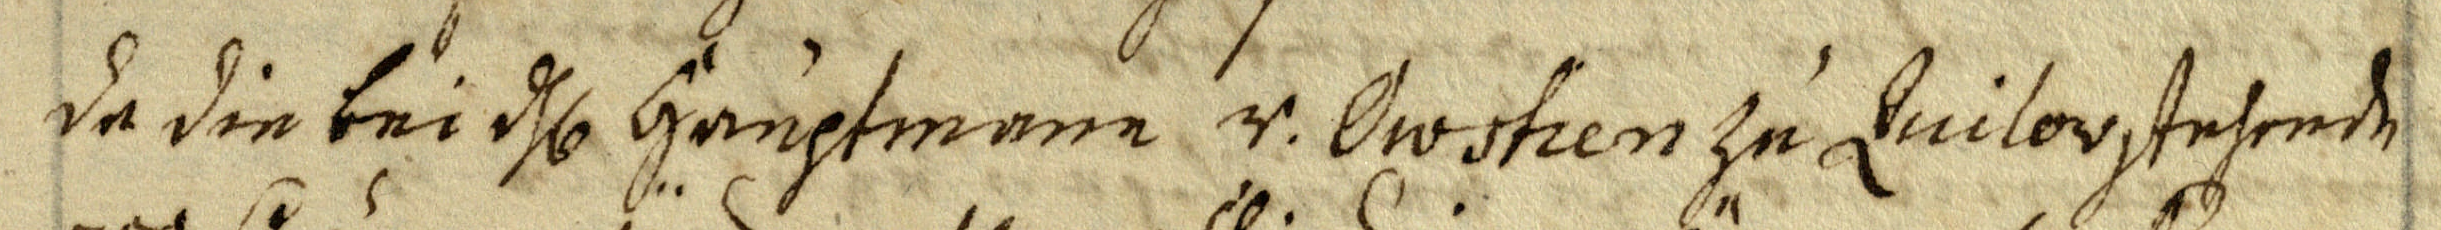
Da die bei dh Hauptmann v. Owstien zu Quilow stehende
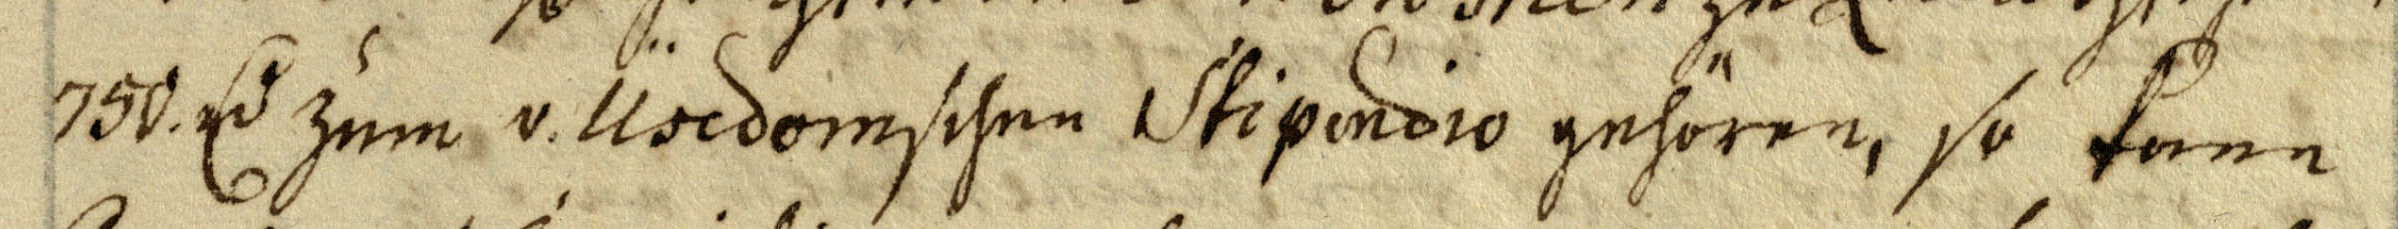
750 rt zum v. Usedomschen Stipendio gehören, so kann
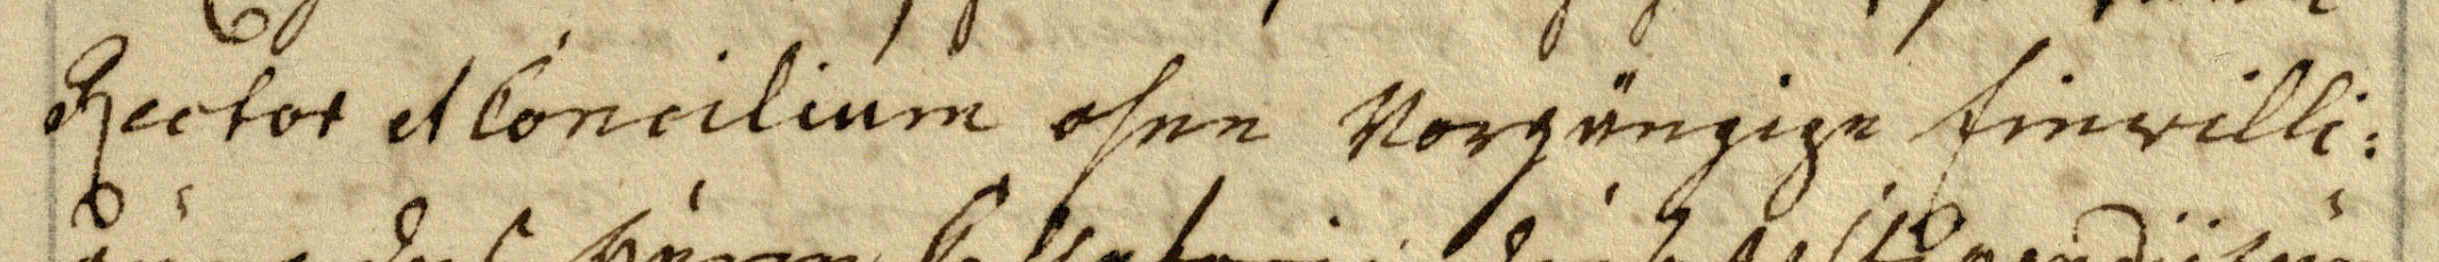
Rector et Concilium ohne vorgängige Einwilli¬
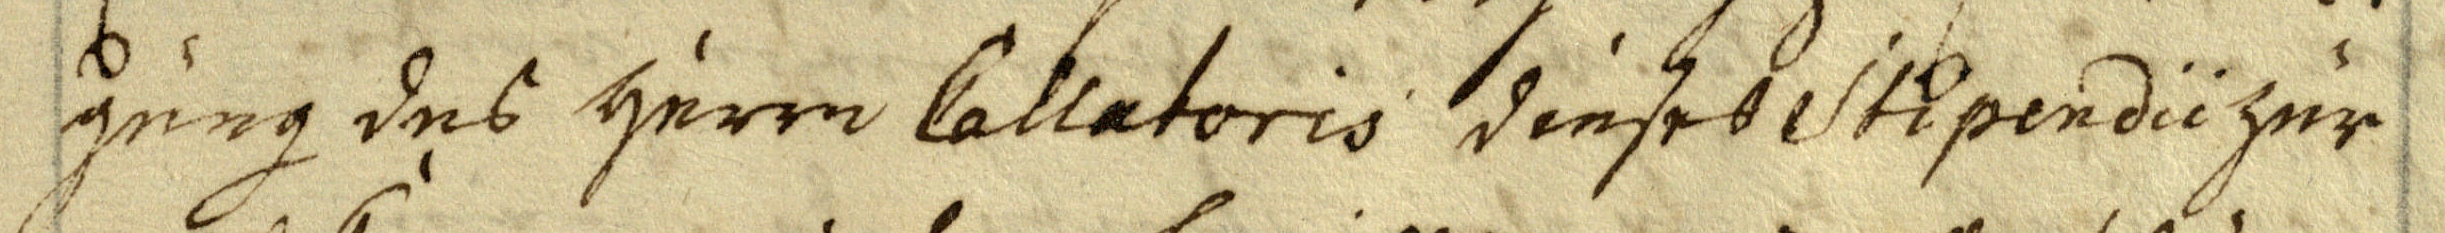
gung des Herrn Collatoris dieses Stipendii zur
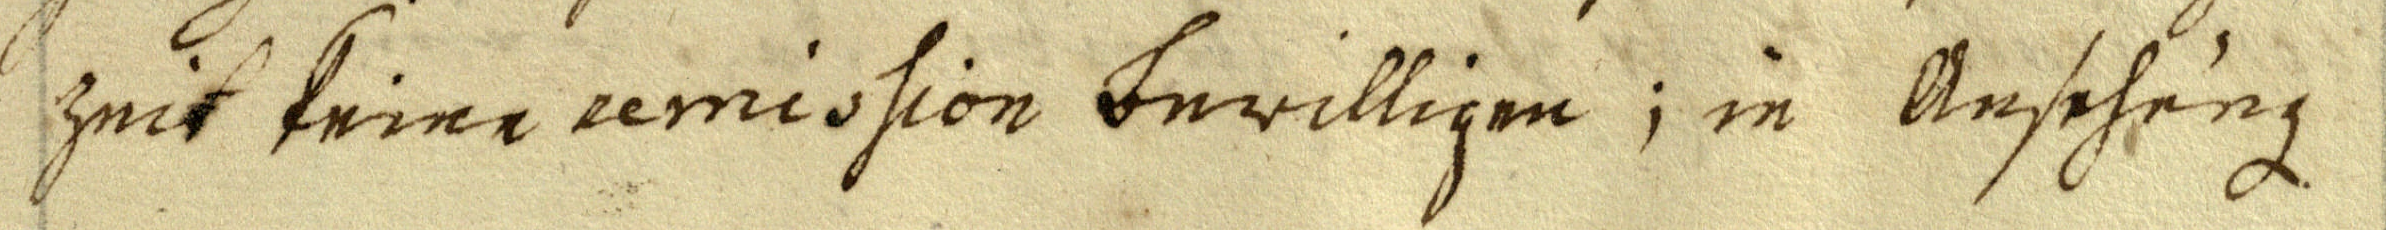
Zeit keine remission bewilligen; in Ansehung
